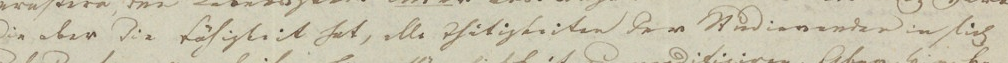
die aber die Fähigkeit hat, alle Thätigkeiten der Studierenden in sich
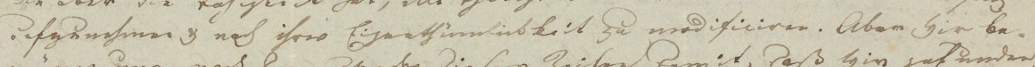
aufzunehmen & nach ihrer Eigenthümlichkeit zu modificiren. Aber wir be-
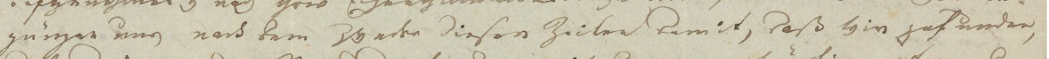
gnügen uns nach dem Zwecke dieser Zeilen damit, daß wir gefunden,
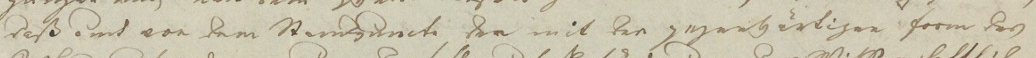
daß auch von dem Standpuncte der mit der gegenwärtigen Form des
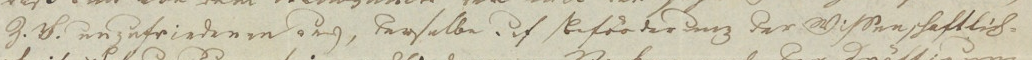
Z.V. unzufriedenen aus, derselbe auf Beförderung der Wissenschaftlich-
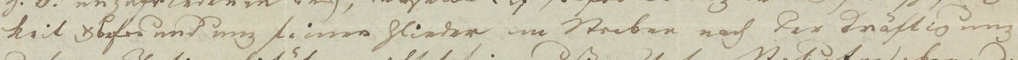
keit & Befreundung seiner Glieder im Streben nach der Kräftigung
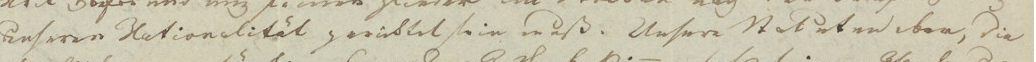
unserer Nationalität gerichtet sein muß. Unsere Statuten aber, die
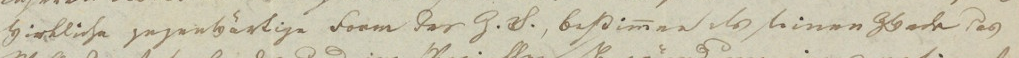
wirkliche gegenwärtige Form des Z.V., bestimmen als seinen Zweck das
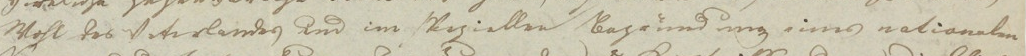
Wohl des Vaterlandes und im speziellen Begründung eines nationalen
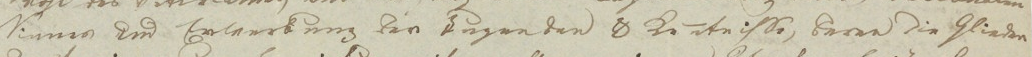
Sinnes und Erwerbung der Tugenden & Kenntnisse, deren die Glieder
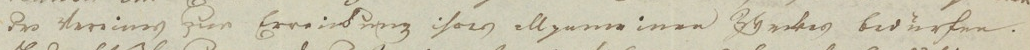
des Vereines zur Erreichung ihres allgemeinen Zweckes bedürfen.
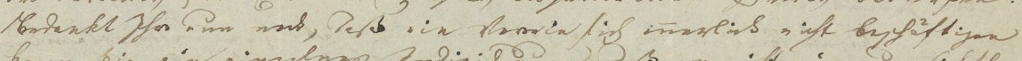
Bedenkt Ihr nun noch, daß ein Verein sich innerlich nicht beschäftigen
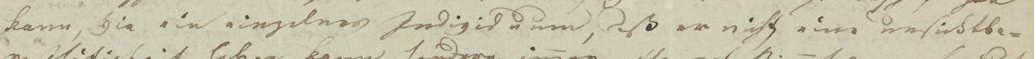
kann, wie ein einzelnes Individuum, daß er nicht eine unsichtba-
